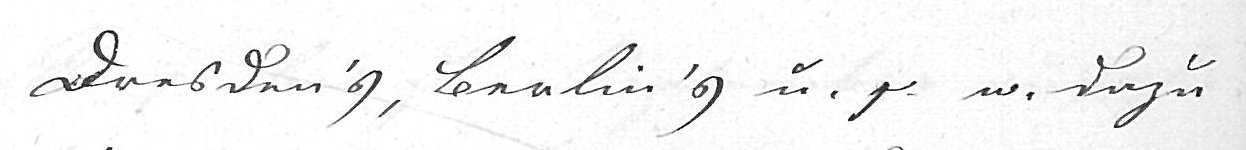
Dresden's, Berlin's u. s. w. dazu
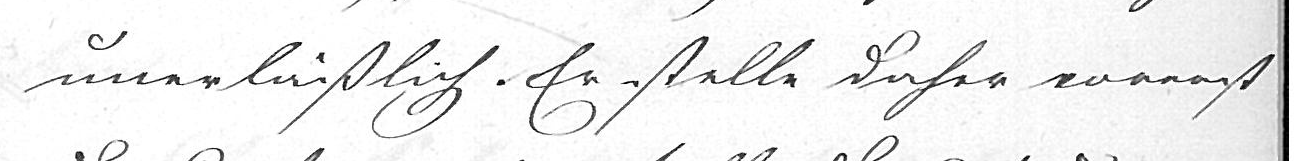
unerläßlich. Er stelle daher vorerst
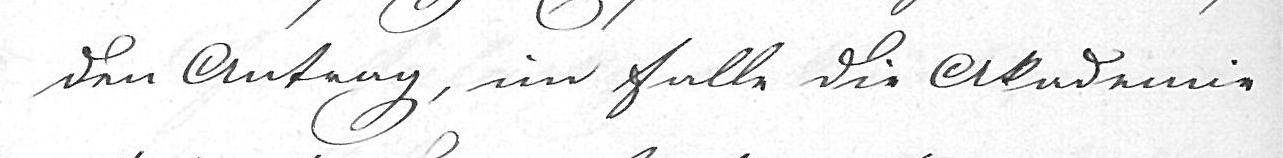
den Antrag, im Falle die Akademie
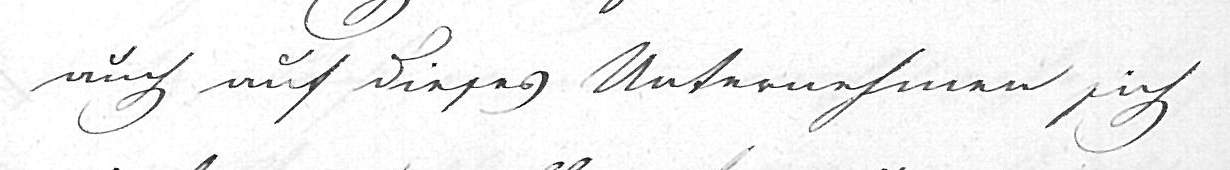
auch auf dieses Unternehmen sich
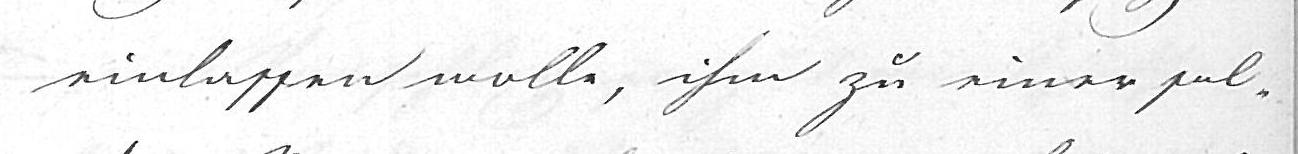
einlassen wolle, ihm zu einer sol-
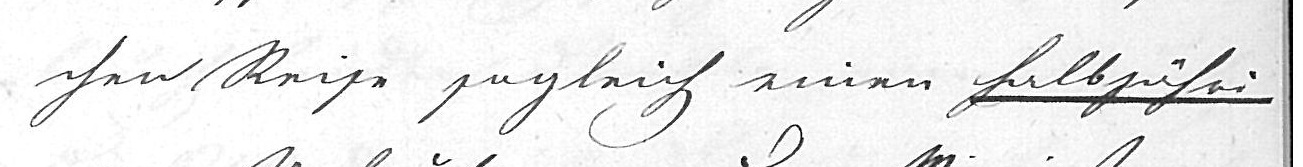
chen Reise sogleich einen halbjähri-
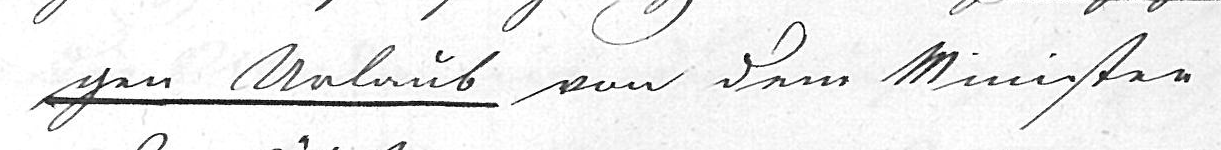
chen Urlaub von dem Minister
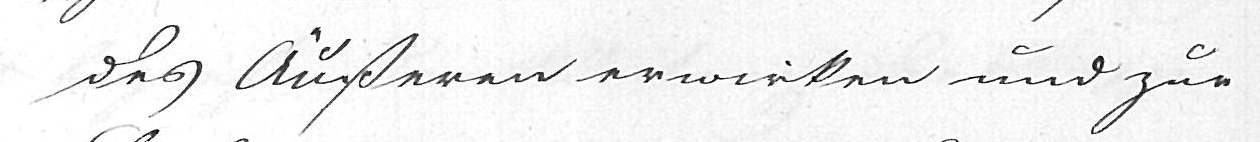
des Äußeren erwirken und zur
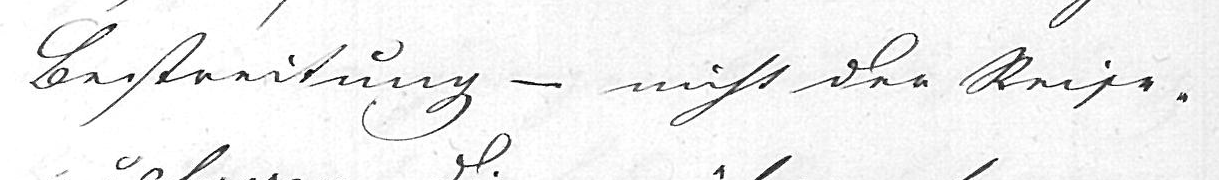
Bestreitung - nicht der Reise-
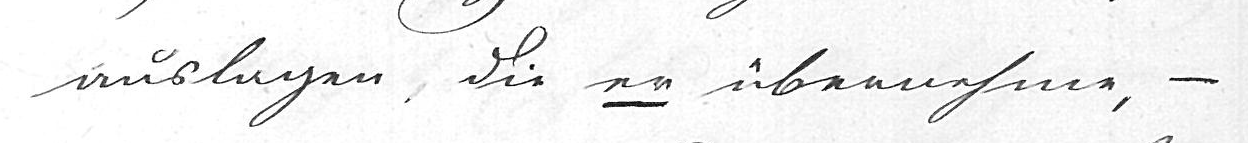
auslagen, die er übernehme, -
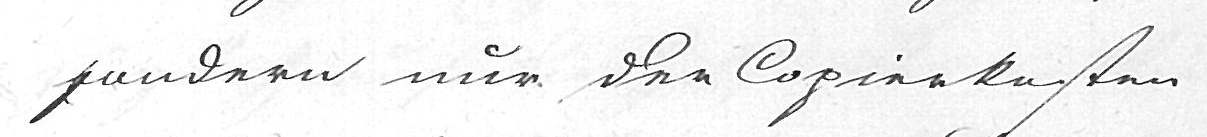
sondern nur der Copierkosten
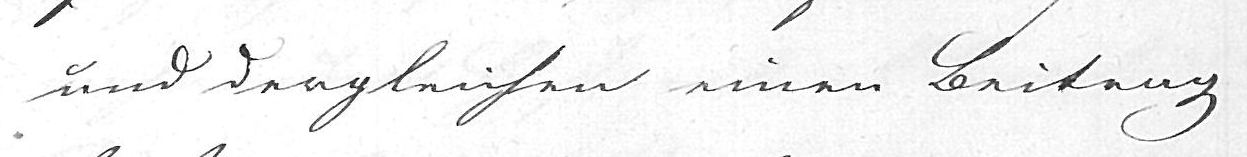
und dergleichen einen Beitrag
